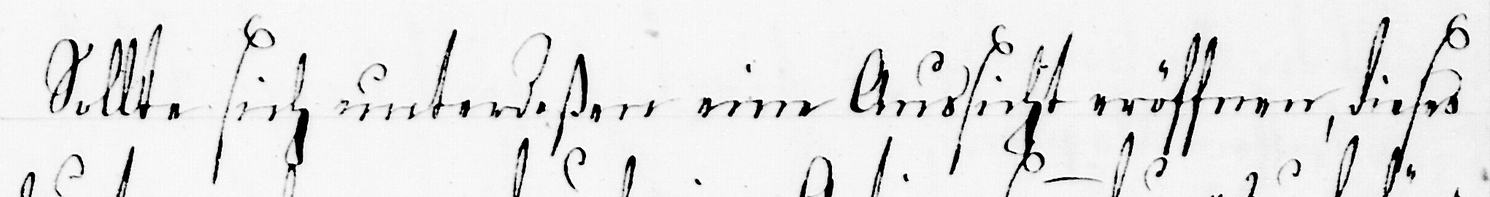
Sollte sich unterdeßen eine Aussicht eröffnen, dieses
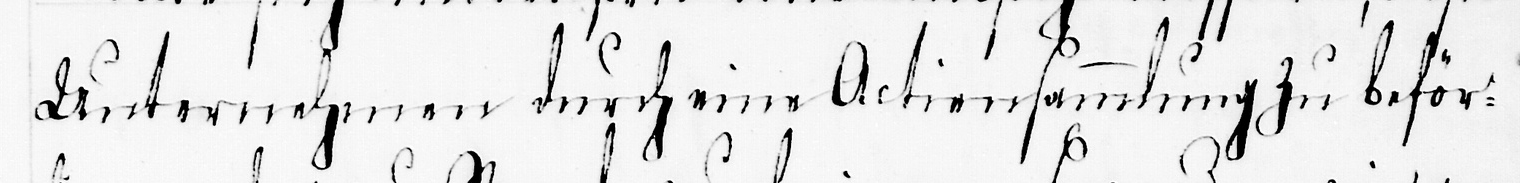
Unternehmen durch eine Actiensammlung zu beför¬
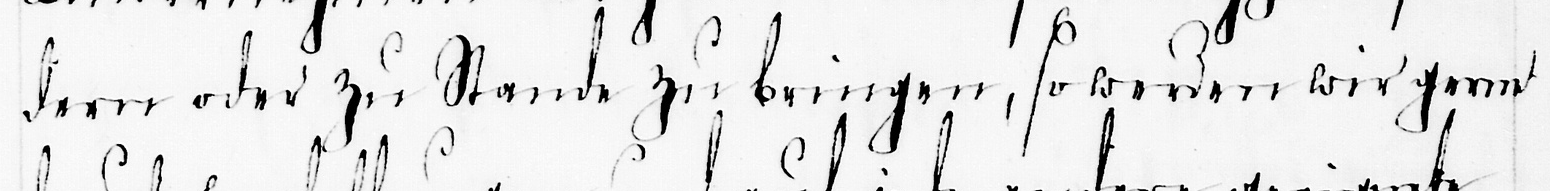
dern oder zu Stande zu bringen, so werden wir gerne
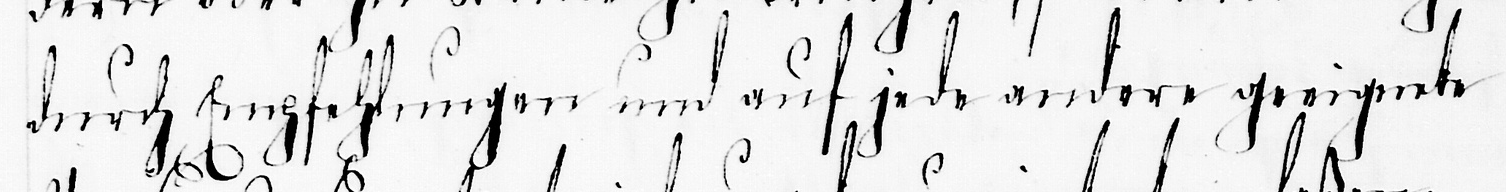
durch Empfehlungen und auf jede andere geeignete
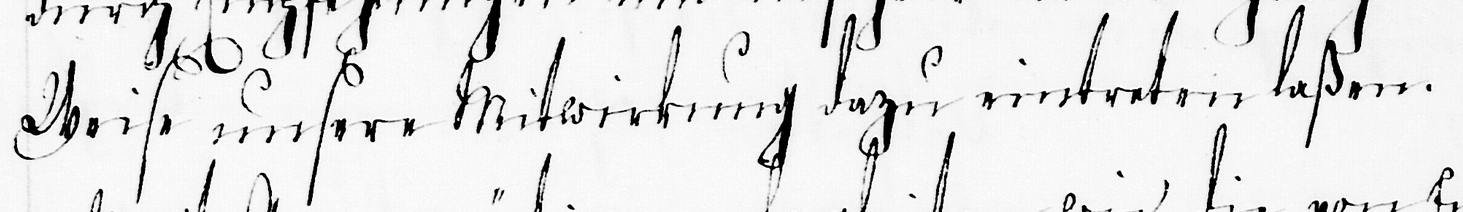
Weise unsere Mitwirkung dazu eintreten laßen.
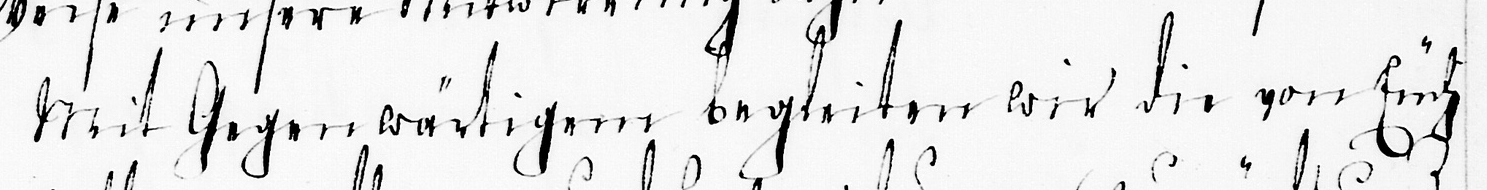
Mit Gegenwärtigem begleiten wir die von Euch
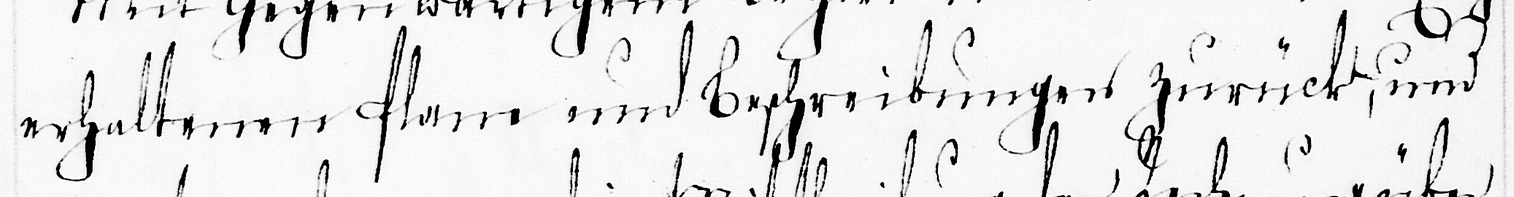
erhaltenen Plane und Beschreibungen zurück, und
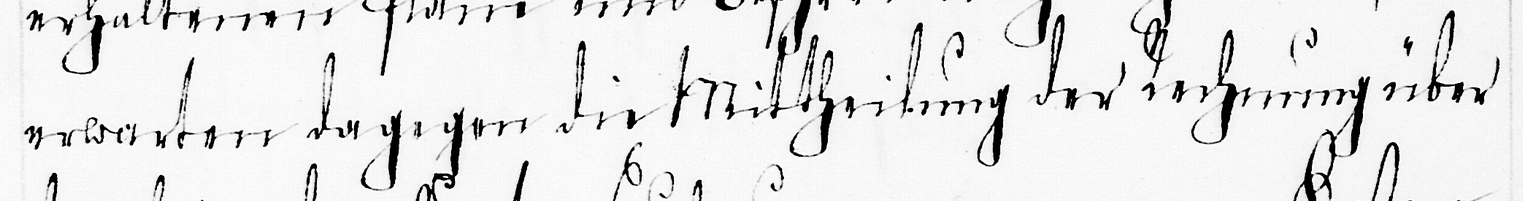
erwarten dagegen die Mittheilung der Rechnung über
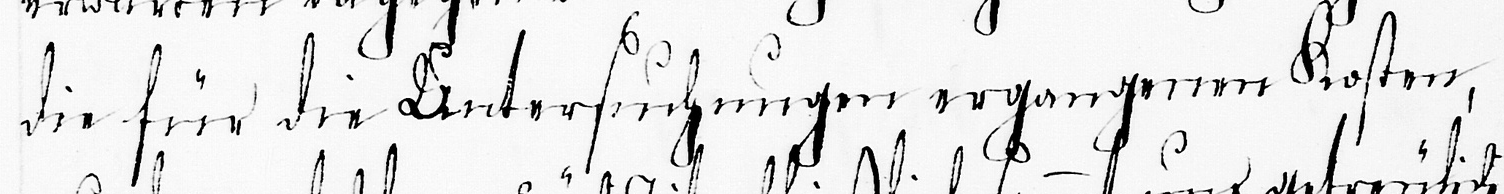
die für die Untersuchungen ergangenen Kosten,
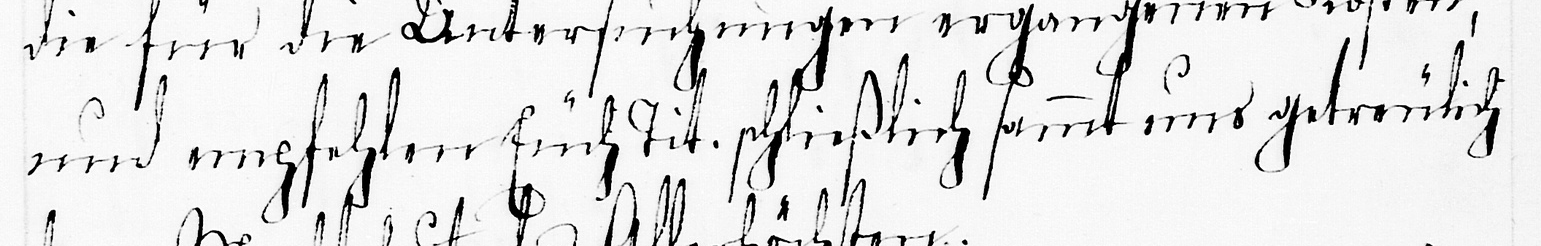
und empfehlen Euch Tit. schließlich sammt uns getreulich
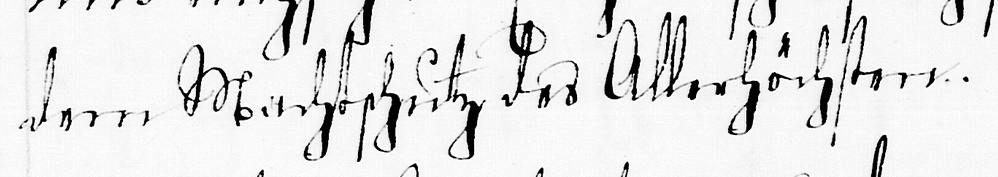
dem Machtschutz des Allerhöchsten.
